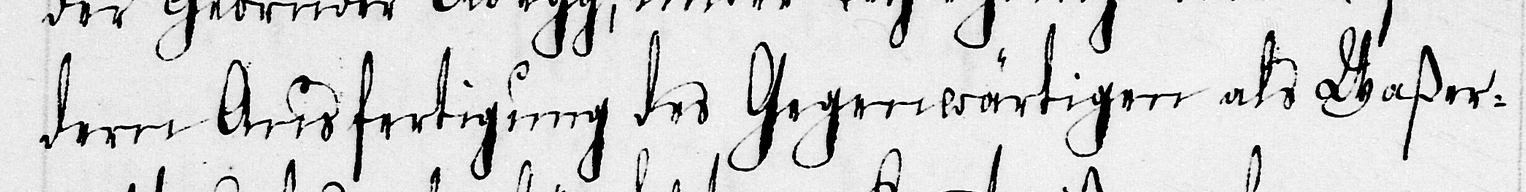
dern Ausfertigung des Gegenwärtigen als Waßer¬
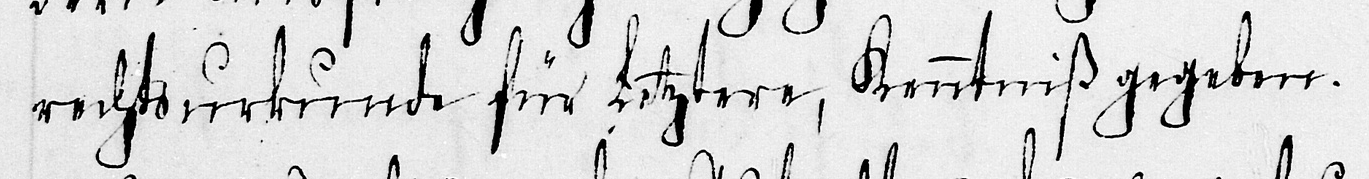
rechtsurkunde für Letztere, Kenntniß gegeben.
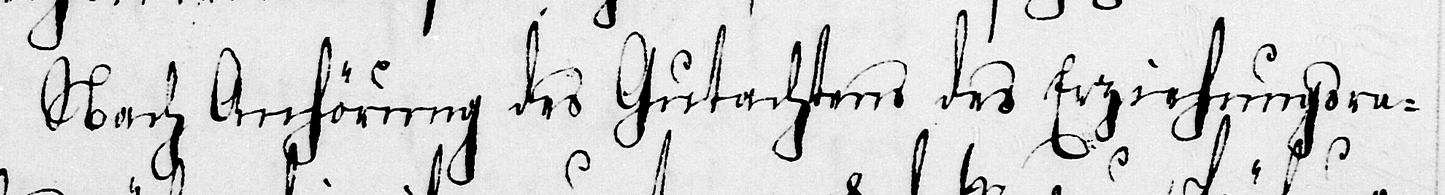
Nach Anhörung des Gutachtens des Erziehungsra¬
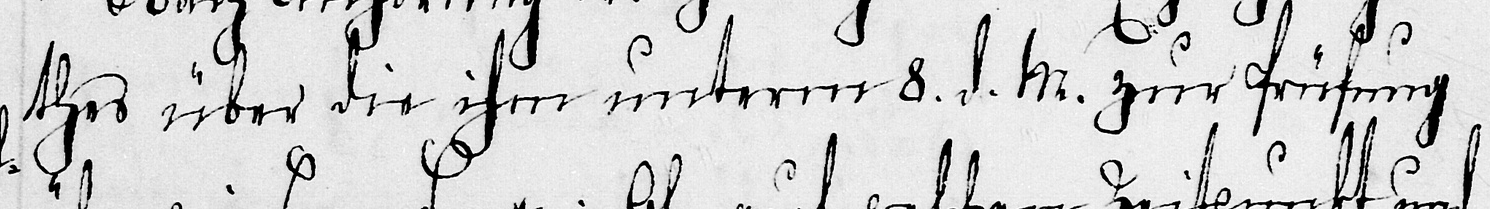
thes über die ihm unterm 8. d. M. zur Prüfung
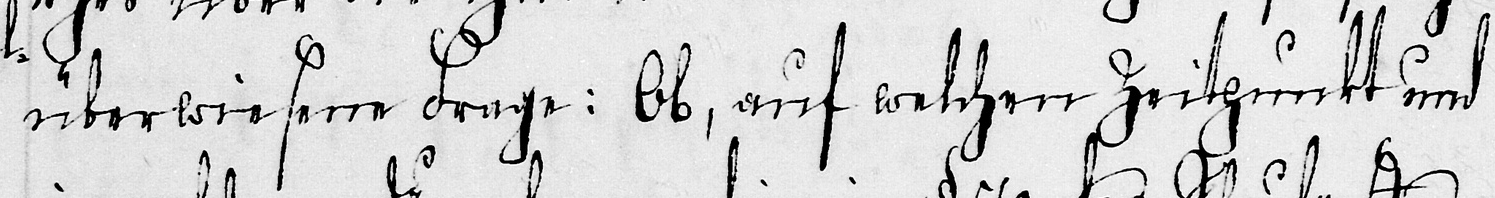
überwiesene Frage: Ob, auf welchen Zeitpunkt und
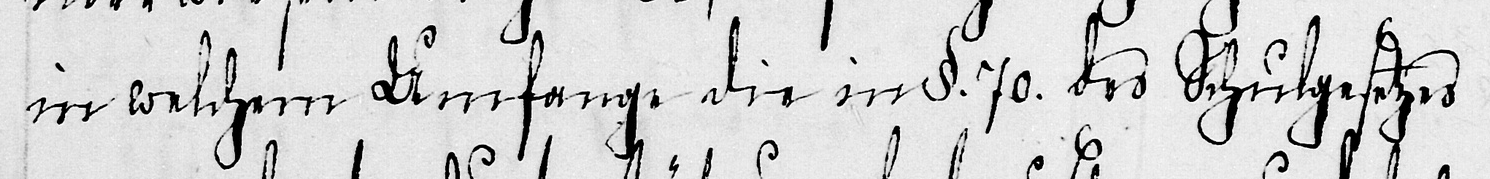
in welchem Umfange die in §. 70. des Schulgesetzes
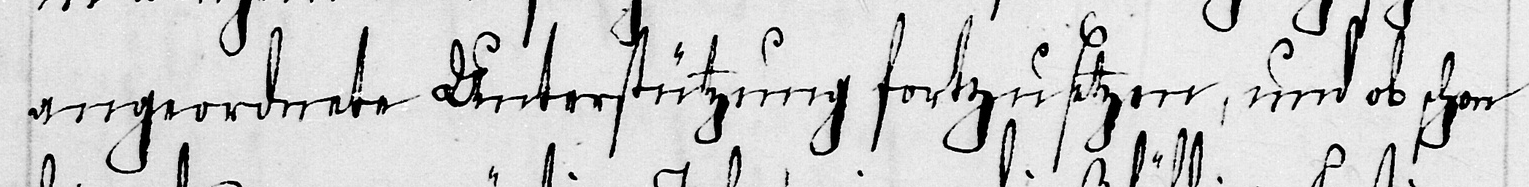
angeordnete Unterstützung fortzusetzen, und ob schon
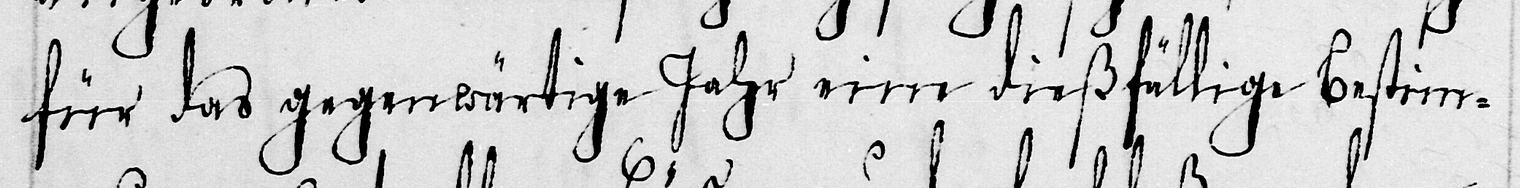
für das gegenwärtige Jahr eine dießfällige Bestim¬
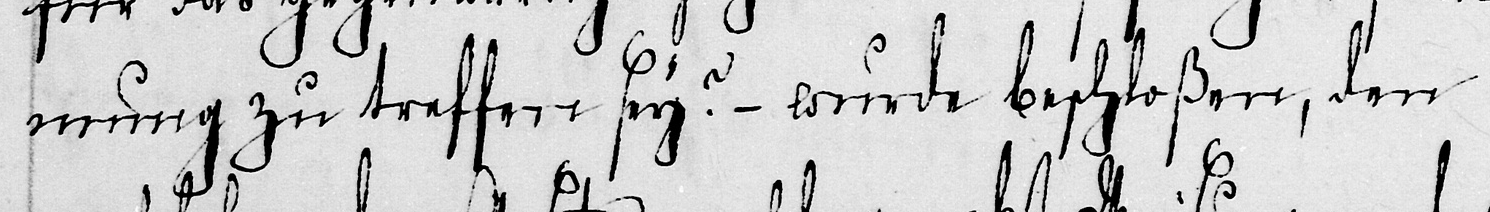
mung zu treffen sey? – wurde beschloßen, den
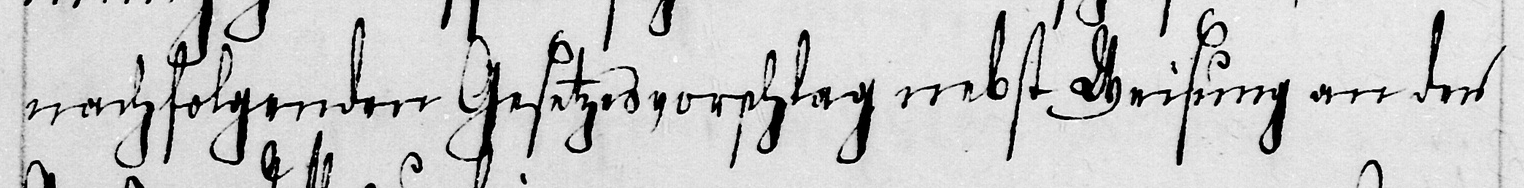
nachfolgenden Gesetzesvorschlag nebst Weisung an den
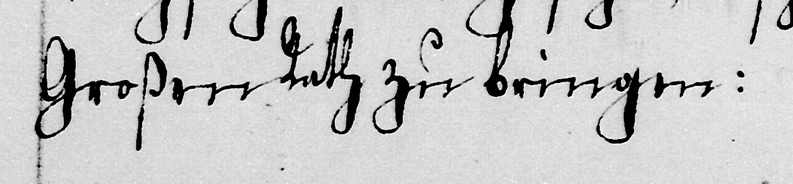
Großen Rath zu bringen:
